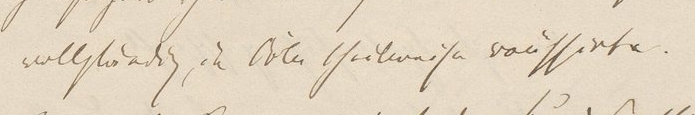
vollständig, in Cöln theilweise reüssirte.
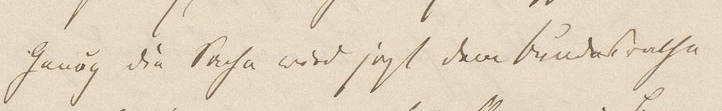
Genug die Sache wird jezt dem Bundesrathe
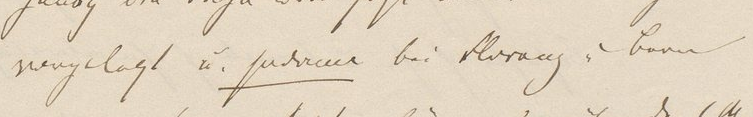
vorgelegt u. sodann bei Florenz u Bern
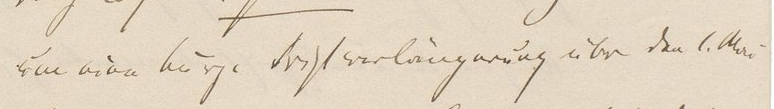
um eine kurze Fristverlängerung über den 1. Mai
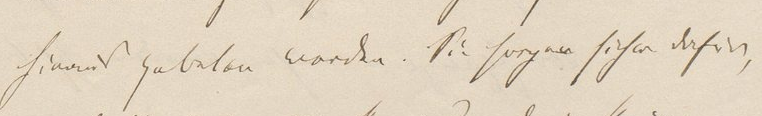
hinaus gebeten werden. Sie sorgen sicher dafür,
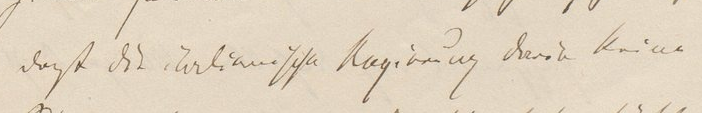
daß die italienische Regierung darin keine
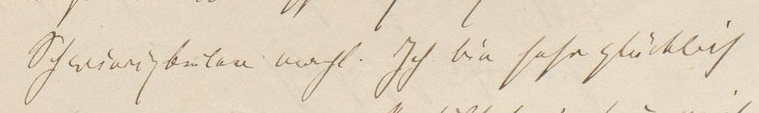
Schwierigkeiten macht. Ich bin sehr glücklich
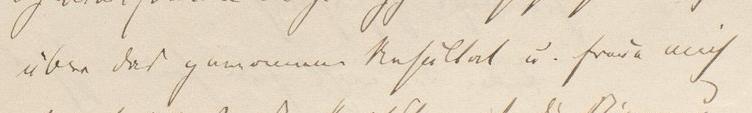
über das gewonnene Resultat u. freue mich
